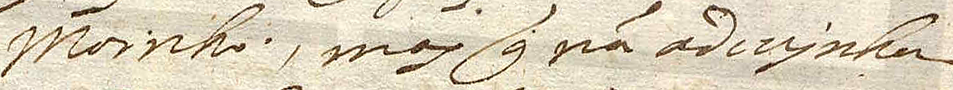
marinho ./ mas q̄ nā adiujnha
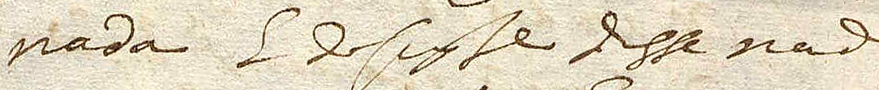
nada E do Custe disse nada
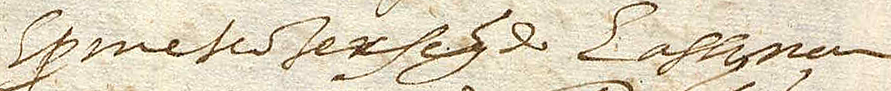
E ꝓmeteo ter seḡdo E assinou
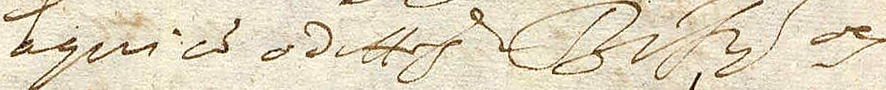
aqui cō o ditto Sr Br̄ frz̄ o es
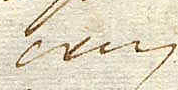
creuj
